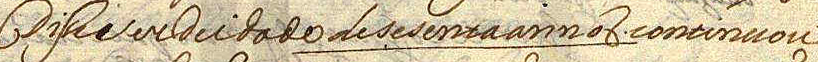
disse ser de idade de sesenta annos continuou
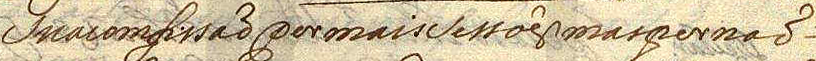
sua comfissaõ por mais sessoẽs mas per naõ
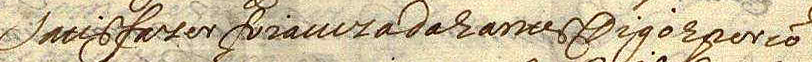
satisfazer foi auizada E antes digo E por cō
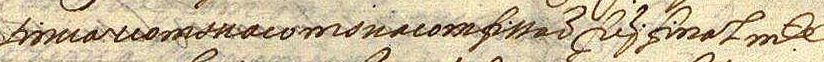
tinuar com sua com sua comfissaõ foj finalm.te
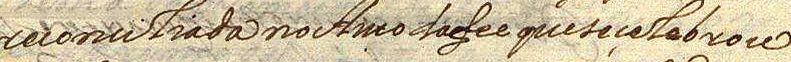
reconciliada no Auto da fee que se çelebrou
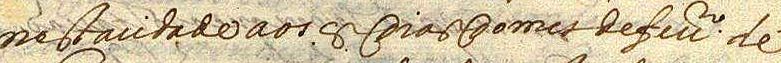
nesta cidade aos 8 dias do mes de feu.ro de
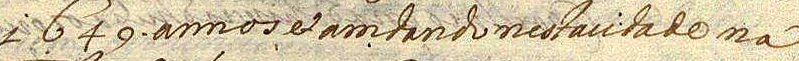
i649. annos & amdando nesta cidade na
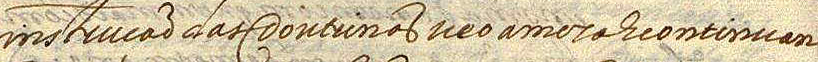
instruçaõ das doutrinas ueo a meza E continuan
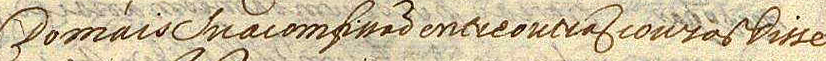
do mais Sua comfissaõ entre outras couzas disse
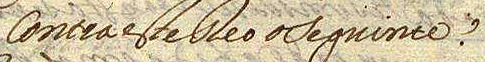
contra este Reo o seguinte.
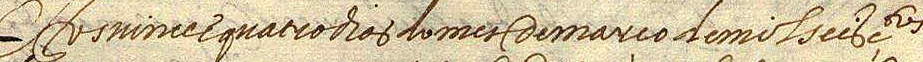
Aos uinte e quatro dias do mes de março de mil seisçtos
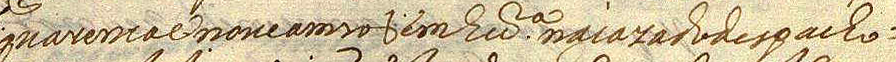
quarenta e noue annos em Eu.ra na caza do despacho
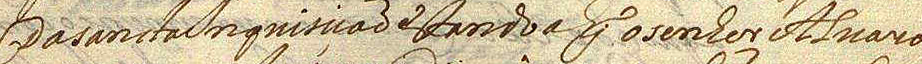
da sancta Inquisiçaõ estando ahj o senhor Aluaro
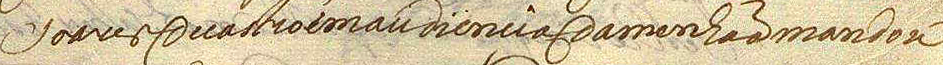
soares de castro em audiençia da menhaã mandou
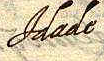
Idade
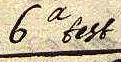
6a testa
